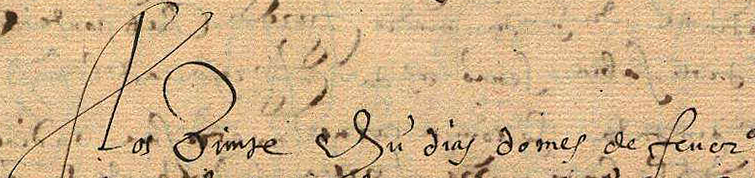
Aos Vimte E hū dias do mes de feuero
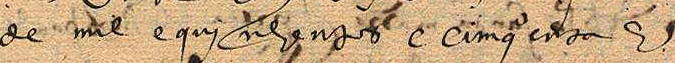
de mil e qujnhentos e cimqoenta E
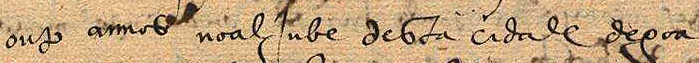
outo annos no alJube desta çidade de goa
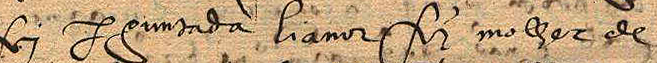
foy ꝑguntada lianor frz̄ molher de
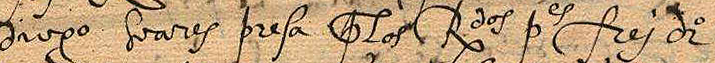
diogo Soares presa p̄los ℞dos pes Frej dio
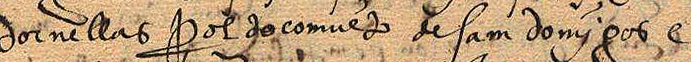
dornellas Ꝓol do comuēto de Sam domj̄gos e
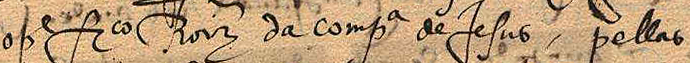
o pe frco Roīz da compa de Jesus / pellas
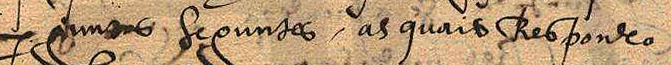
ꝑguntas Seguintes / as quais Respondeo
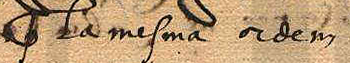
p̄la mesma ordem
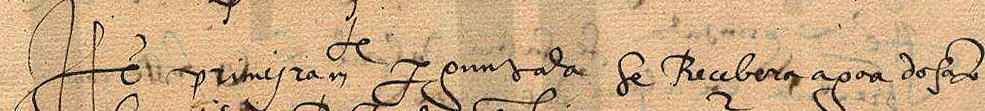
Jtē primejramte ꝑguntada Se Reçebera agoa do sāto
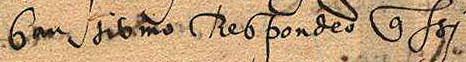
bautismo Respondeo q̄ ssj
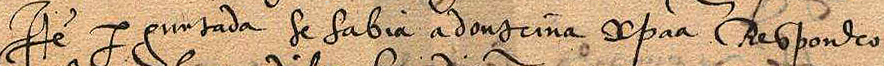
Jtē ꝑguntada se sabia a doutrina xpaā Respondeo
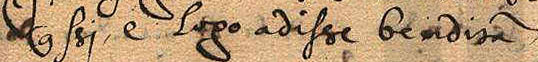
q̄ ssj e logo a disse bem ditā /
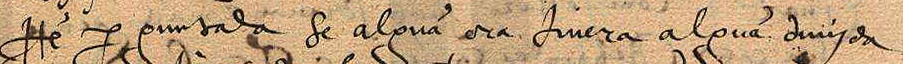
Jtē ꝑguntada se alguā ora tiuera alguā duujda
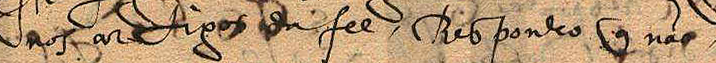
nos artigos da fee / Respondeo q̄ não
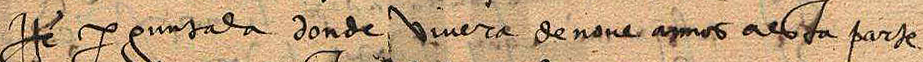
Jtē ꝑguntada donde viuera de noue annos a esta parte
